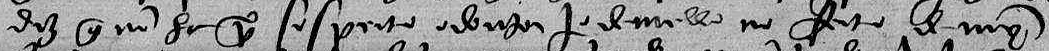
diz q̄ nō ha p̄o sospeito o doutor Jo de mello no feito de mȳ
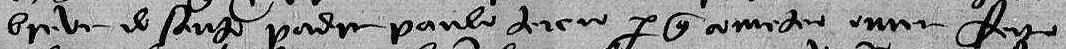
breve do santo padre paulo tercro ꝑ q̄ cometeo o meu feito
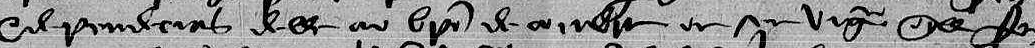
e dependecias delle ao bpō de coinbra ou seu Vigro o q̄ll foy
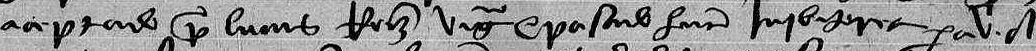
aceptado p̄o lucas Roiz̄ Vigro e pasado huā Jnjbitorea ꝑa v. A.
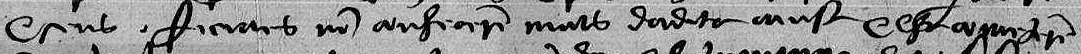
e seus oficiaes nō conhecerē mais da dita causa e lhe cometerē
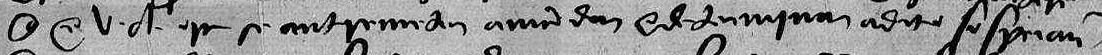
q̄ ē V. A. ora se antremeter a mādar e determjnar a dito sospeiçaõ
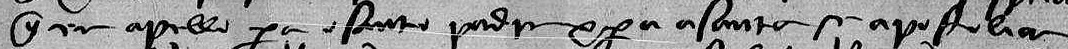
q̄ eu apello ꝑa o santo padre e ꝑa a santa se apostolica
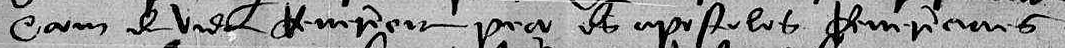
e com devida Reuerēcia peço os apostolos Reuerēciaes
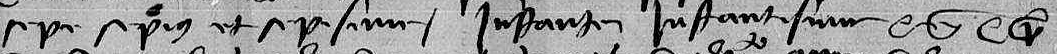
sepe sep̄iꝯ et sepisime / Jnstanter Jnstantisime e c̄ꝭ e p̄o
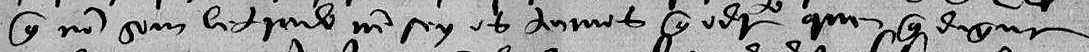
q̄ nō som letrado nē sey os termos q̄ o drto quer q̄ digua
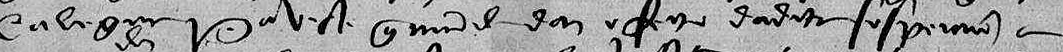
e alegue P a v. A. q̄ māde dar o feito da dita sospeiçaõ a
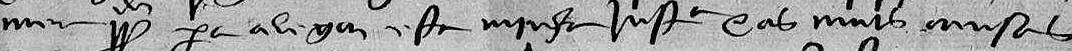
meu ꝓꝓdor ꝑa alegar esta mjnha Justa e as mais causas
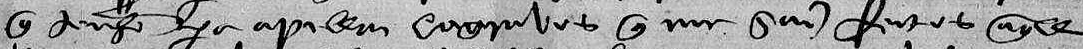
q̄ tenho ꝑa apellar e agravos q̄ me saõ feitos a q̄ll
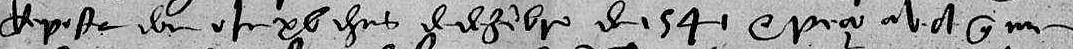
Reposta dou oJe xb de dezēbro de i54i e peço a v. A. q̄ me
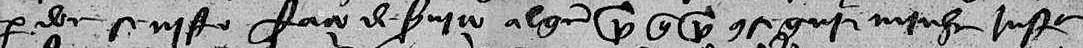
ꝑdoe se njsto faço deꞩujço algū p̄oq̄ p̄o ꝯsegujr mjnha Justa
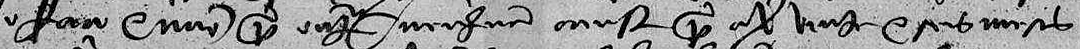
o faço e não p̄o outra nenhuā causa p̄o aꝟ vinte e seis meses
